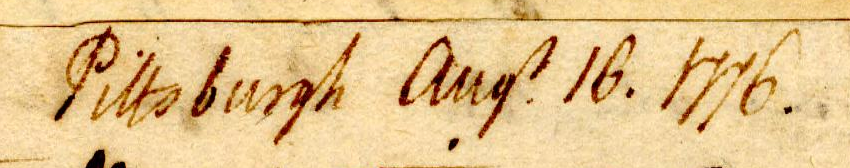Pittsburgh Aug^t. 16. 1776.
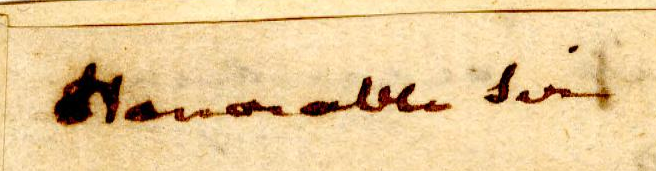Honorable Sir
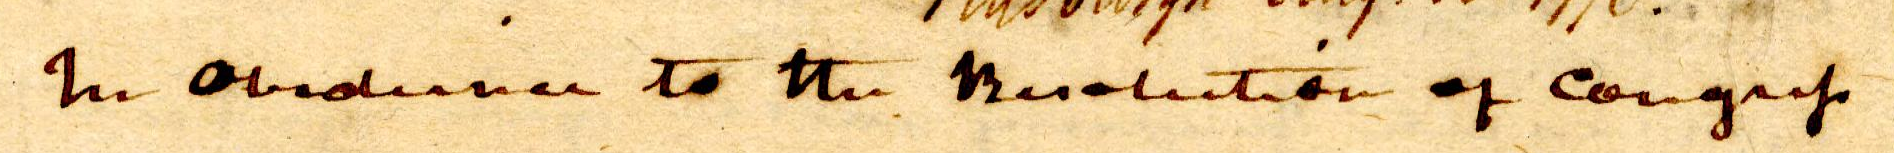In advance to the Resolution of Congress
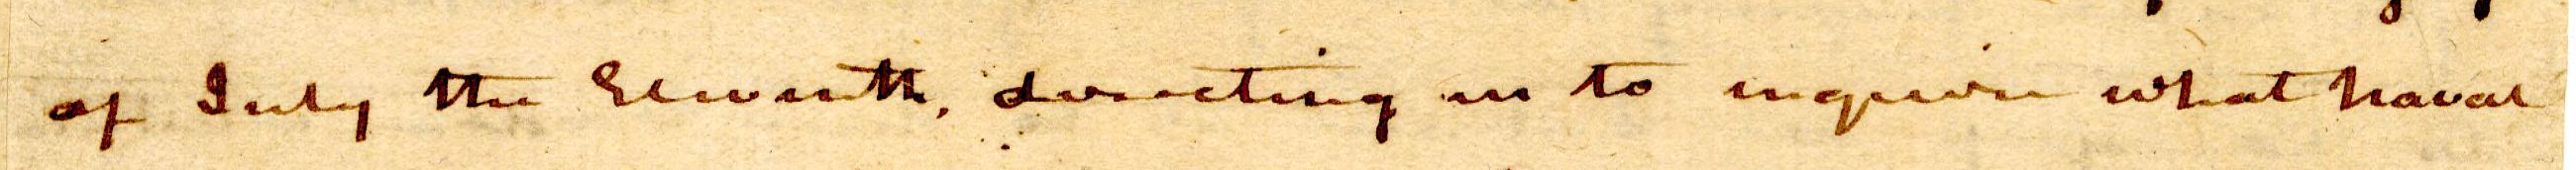of July the Eleventh, directing us to inquire what naval
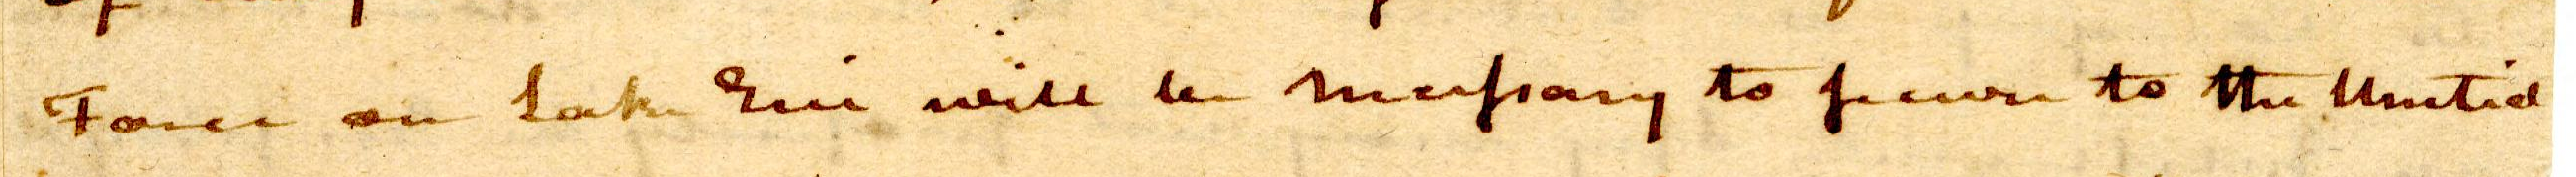Force on Lake Erie will be necessary to secure to the United
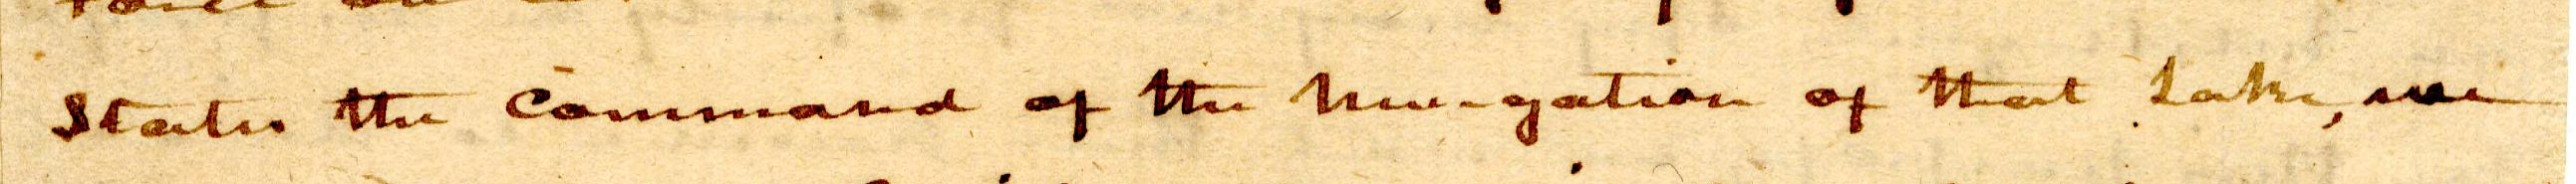States the Command of the navigation of that Lake, we
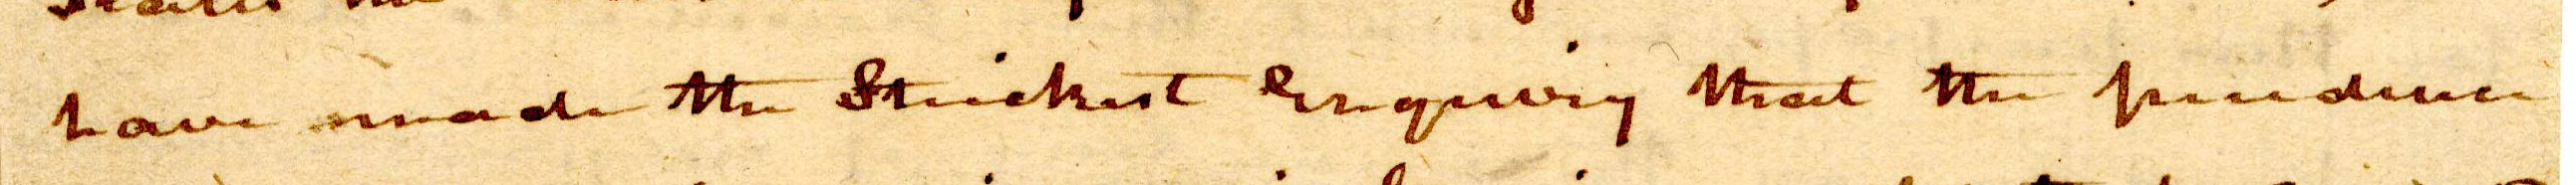have made the Strickest Enquiry that the prudence
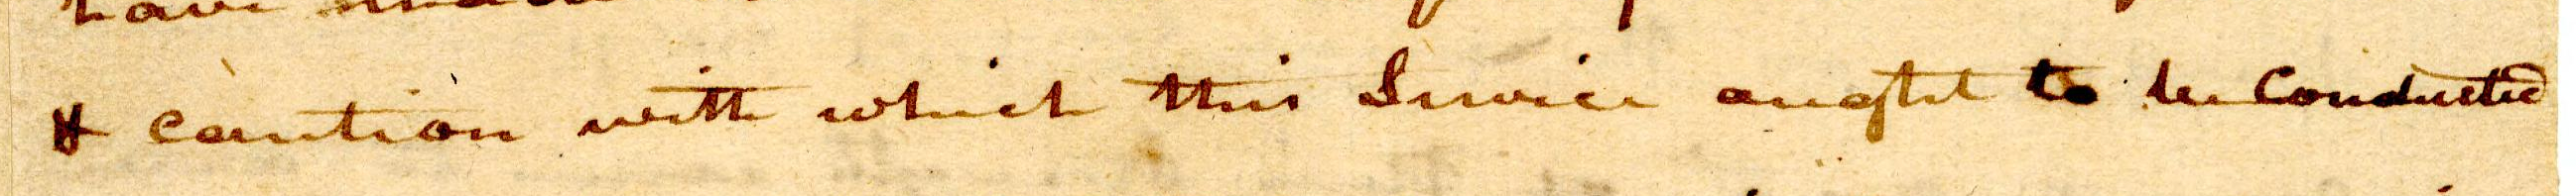& caution with which this Service ought to be Conducted
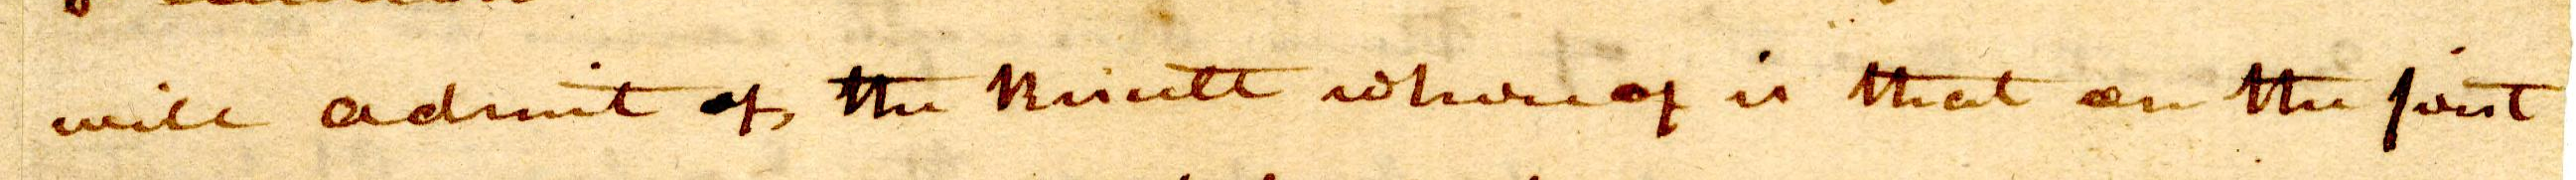will admit of, the Result where of is that on the first
